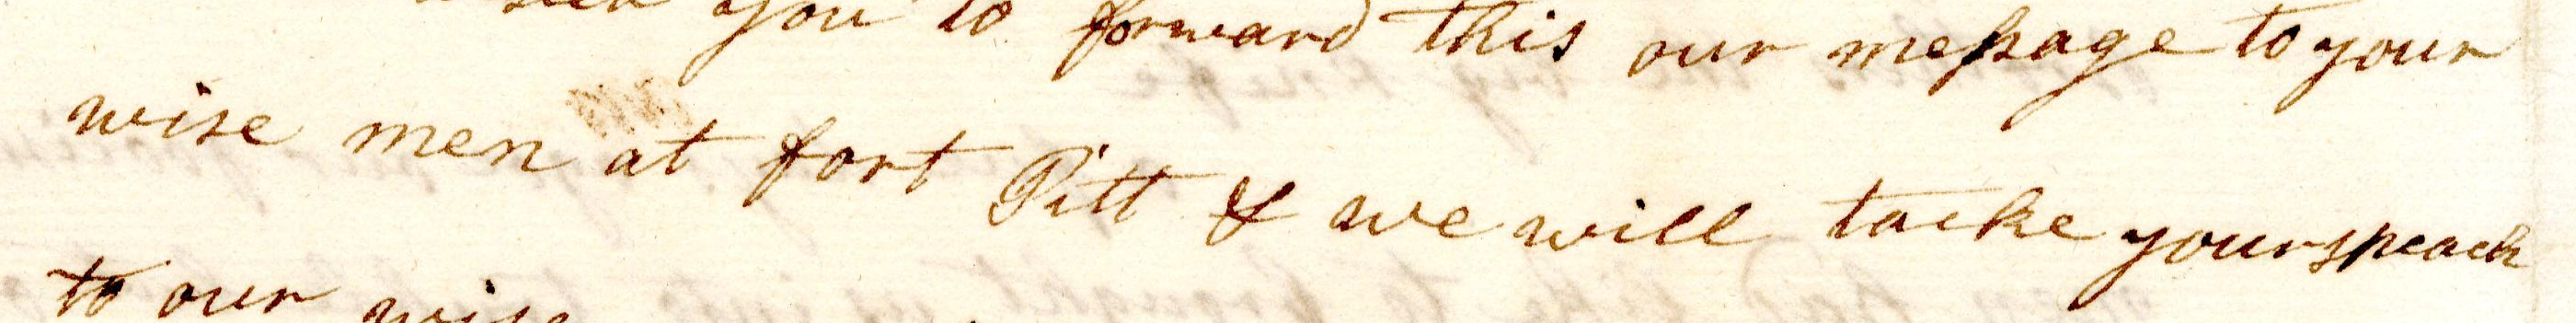wise men at fort Pitt & we will tacke your speach
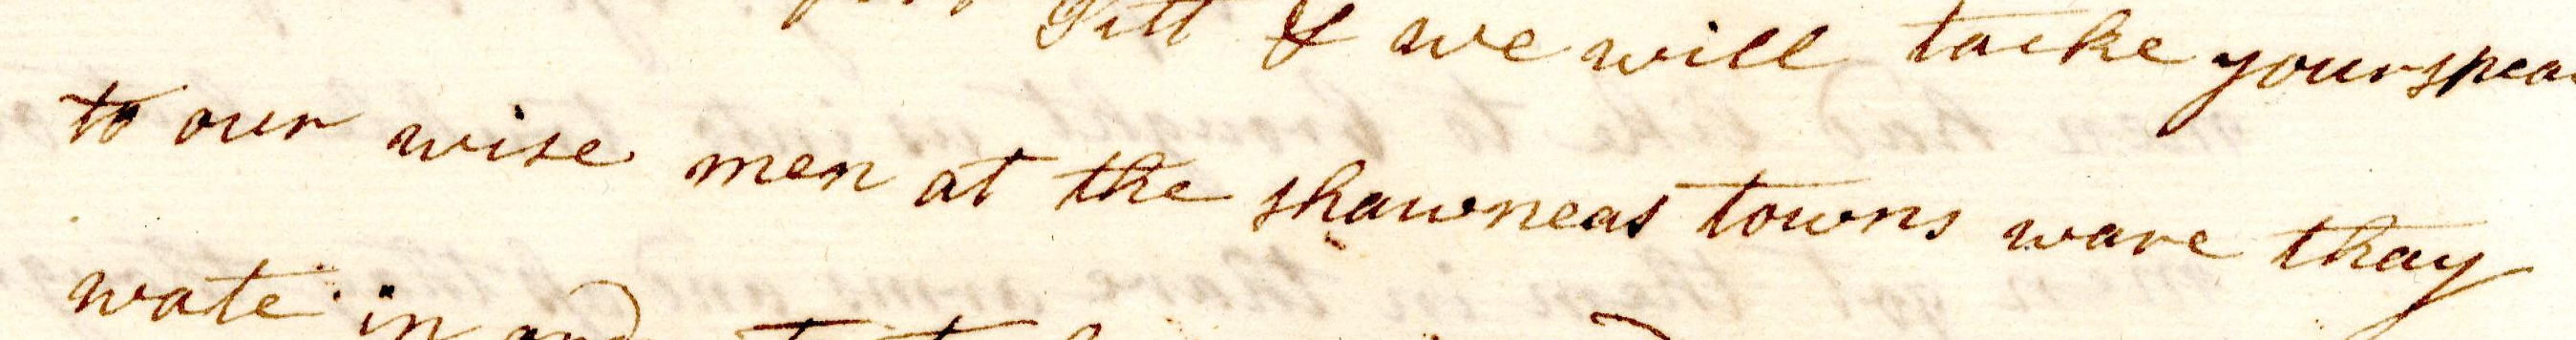to our wise men at the shawneas towns ware thay
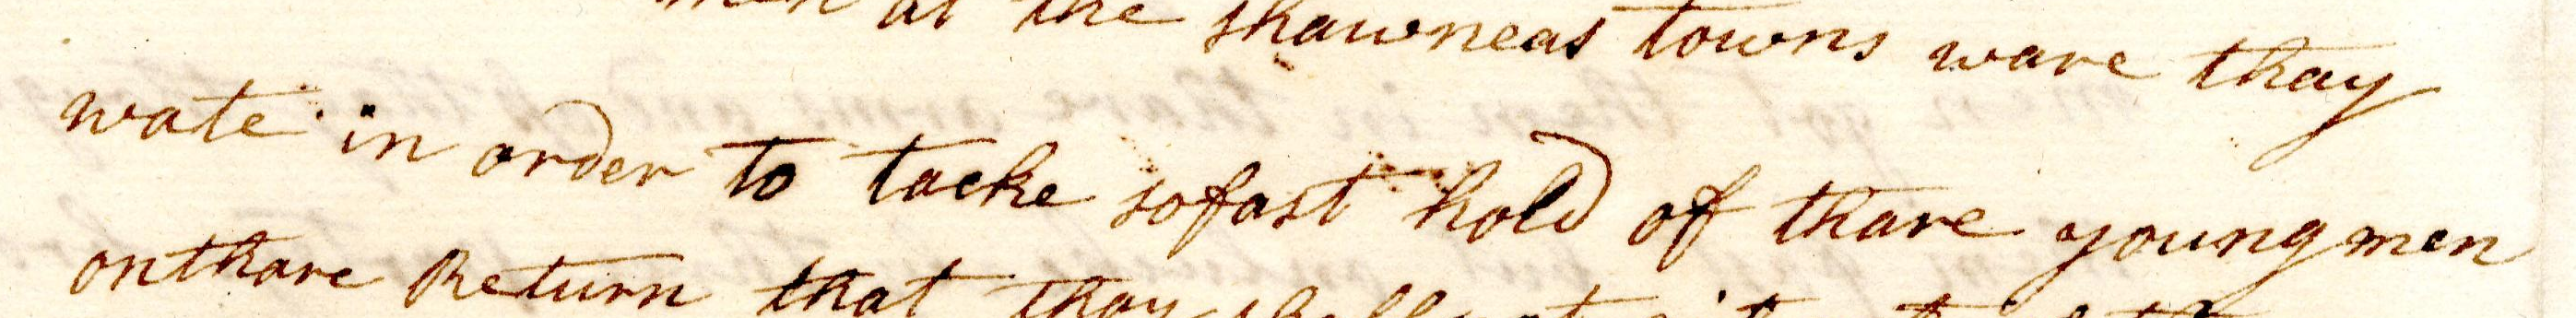wate in order to tacke so fast hold of thare young men
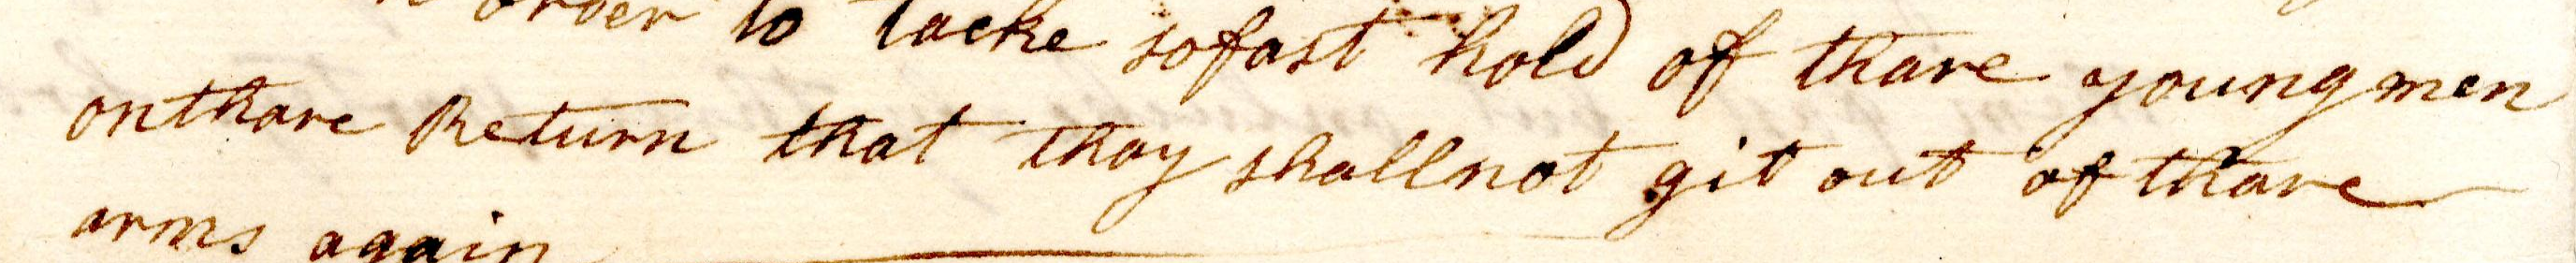on thare Return that thay shall not git out of thare
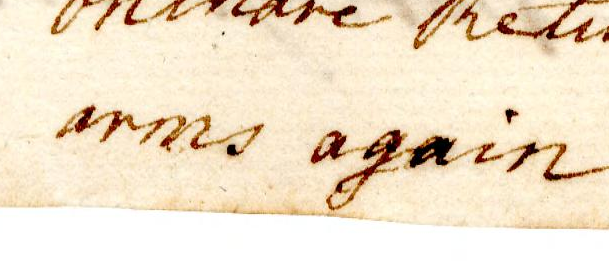arms again-
